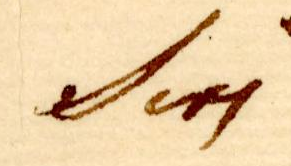Sirs
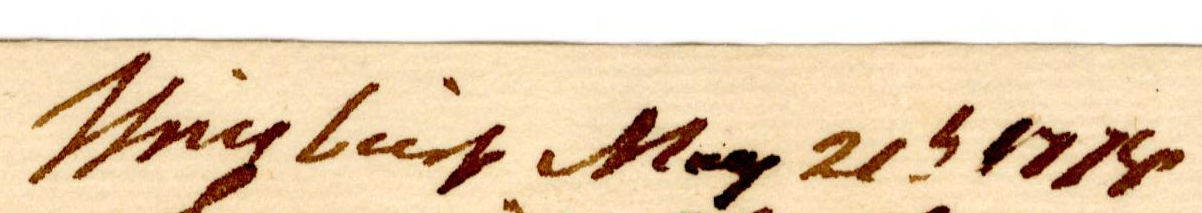Wmsburg May 21^st 1778
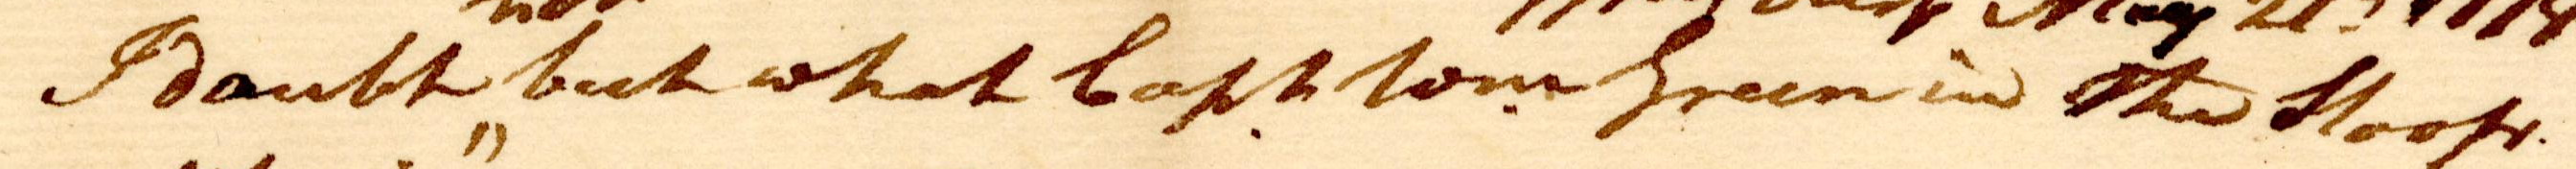I doubt ^ but what Captain Tom Green in the sloop
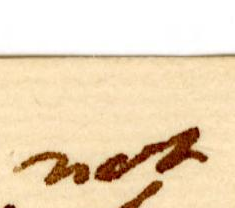not
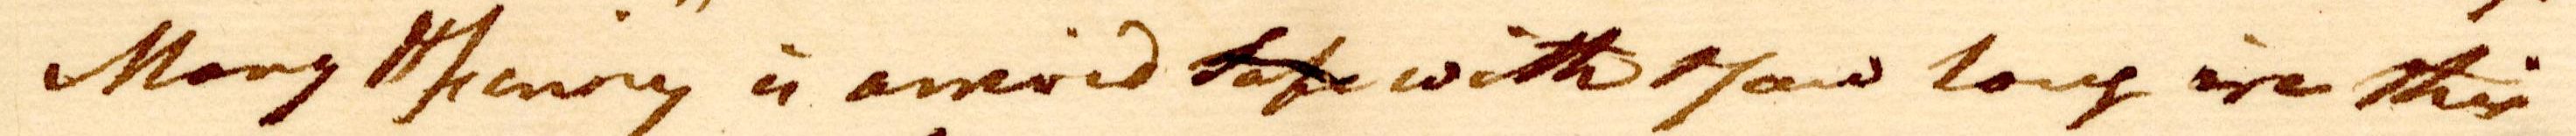Many & Fanny is arrived Safe with you long ere this
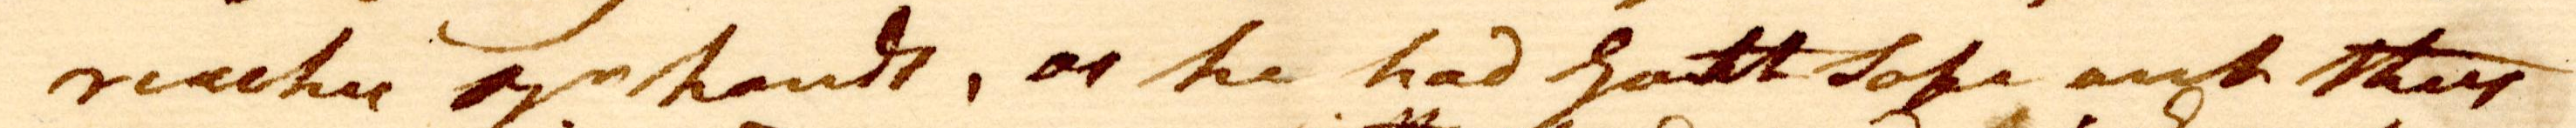reaches y^r hands, as he had Gott safe out this
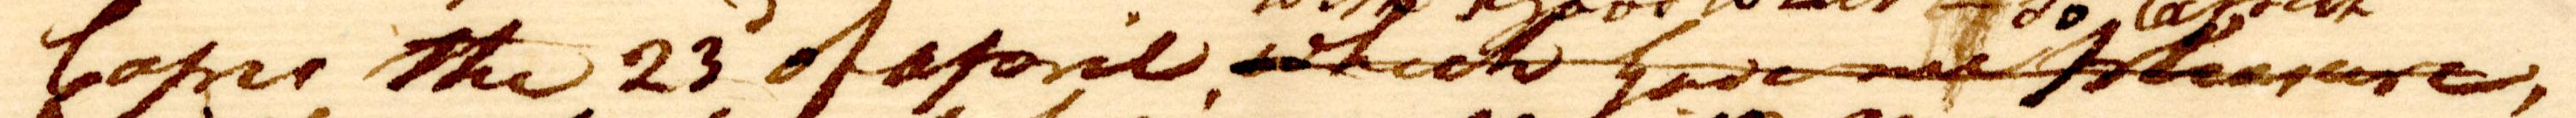Capes the 23^d of april [which gave me pleasure,]
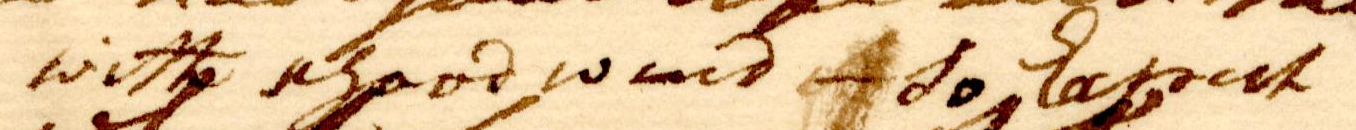with a good word- so Expect
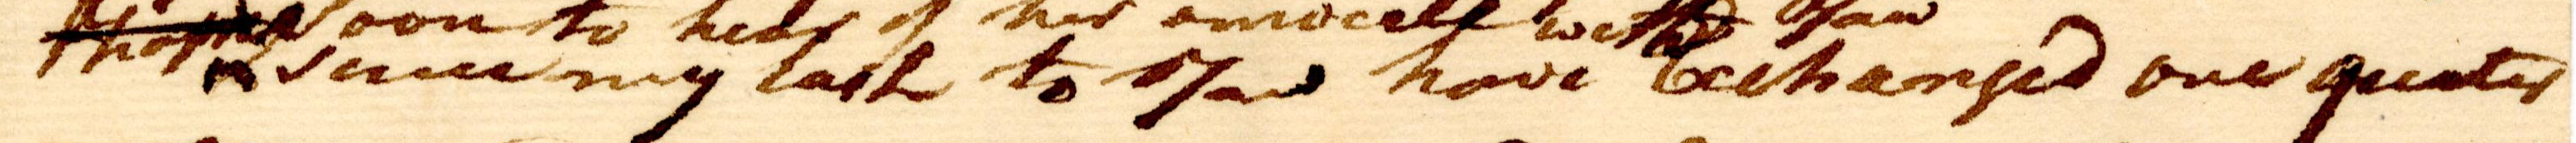[that] save my cash to you have Exchanged one quater
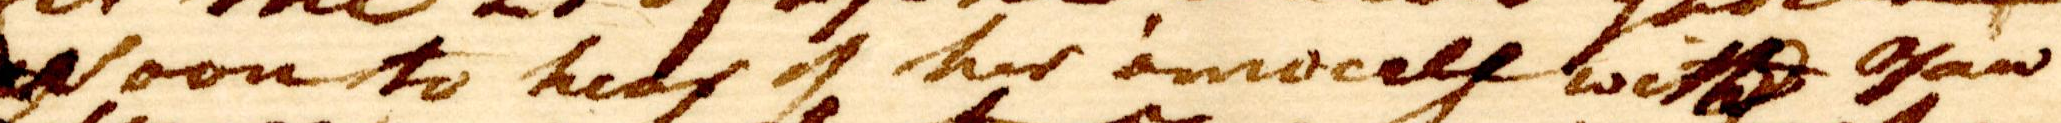soon to hear of her answer with you
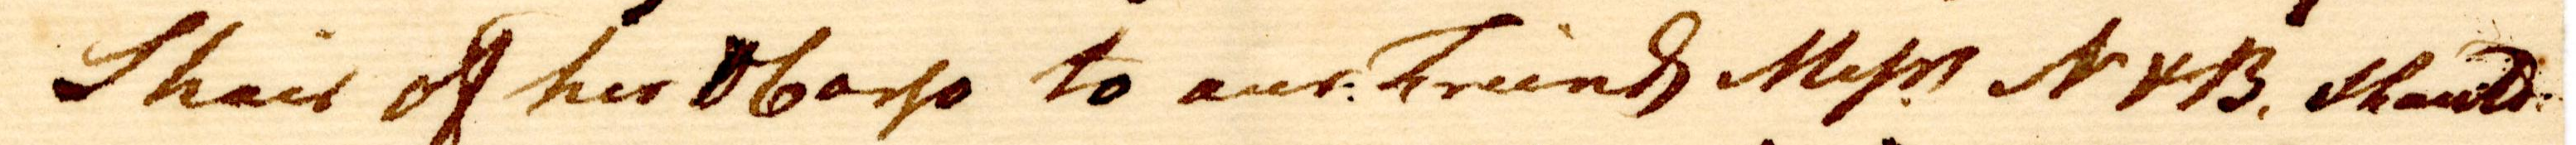Shair of her [_] Cargo to our Friends Mess^rs M & B. Should
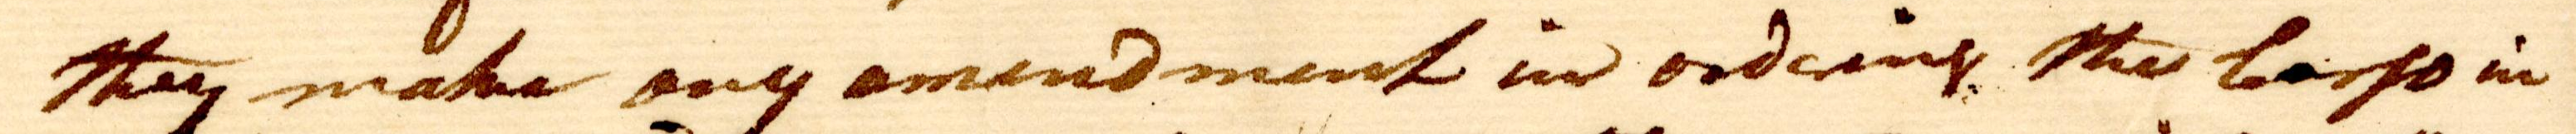they make any amendment in ordering the Cargo in
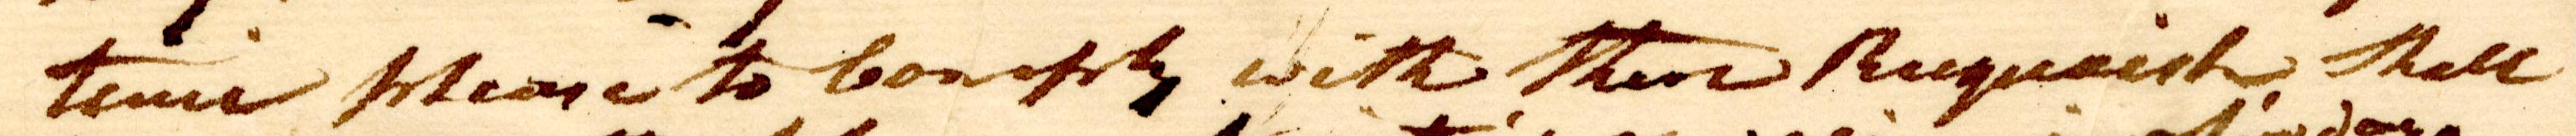time please to Comply with there Request, shall
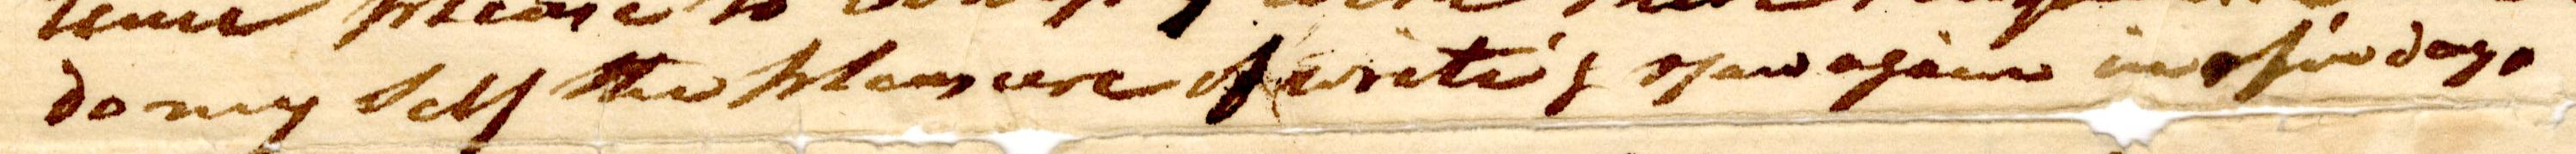do my self the pleasure of write'g you again in a few days
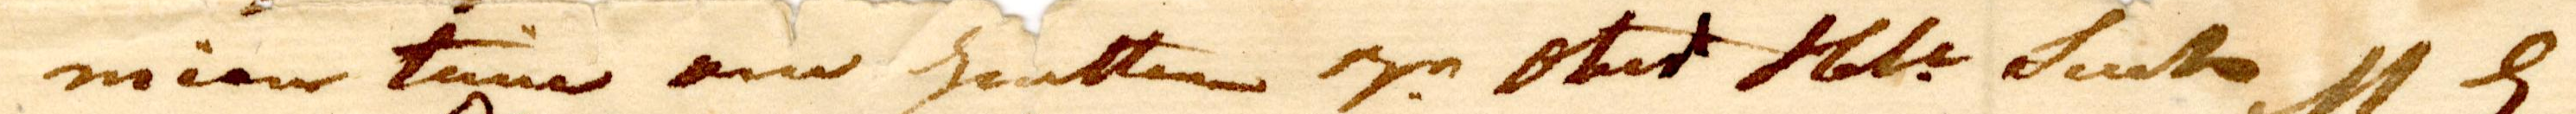mean time now sending y^r obed^t Hb^l.e Ser^t M G
